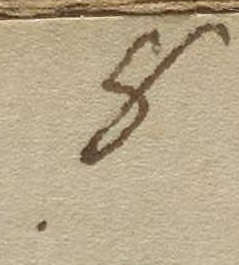8
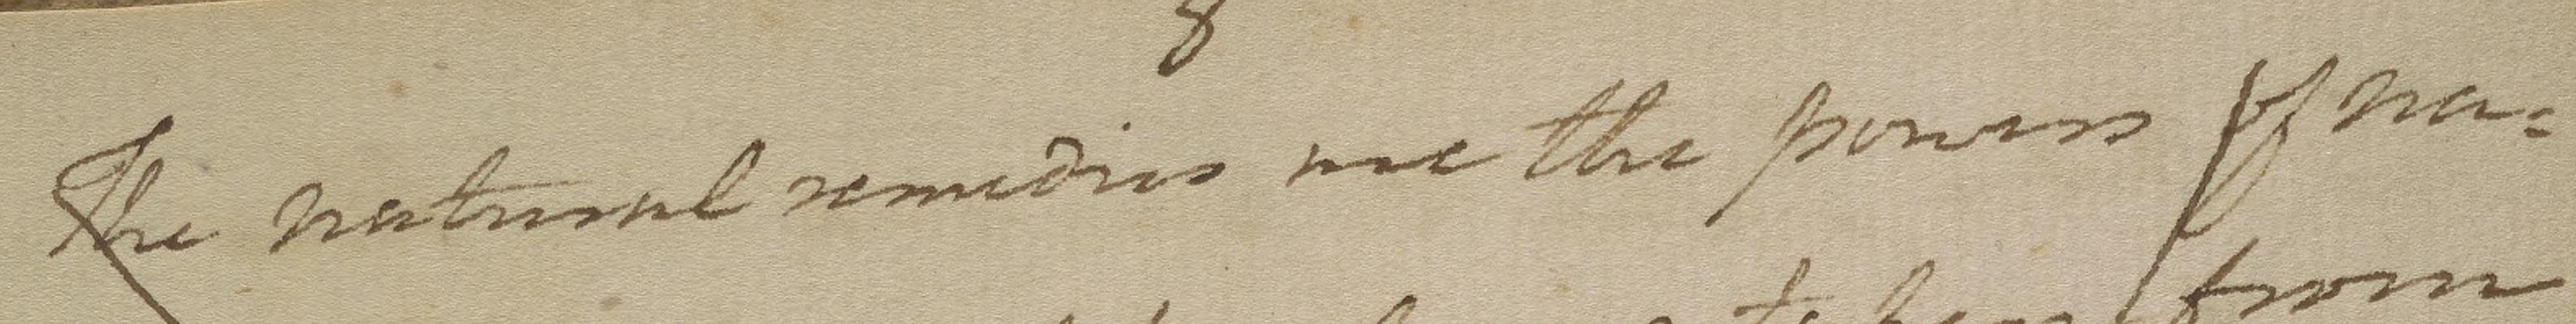The natural remedies are the power of na-
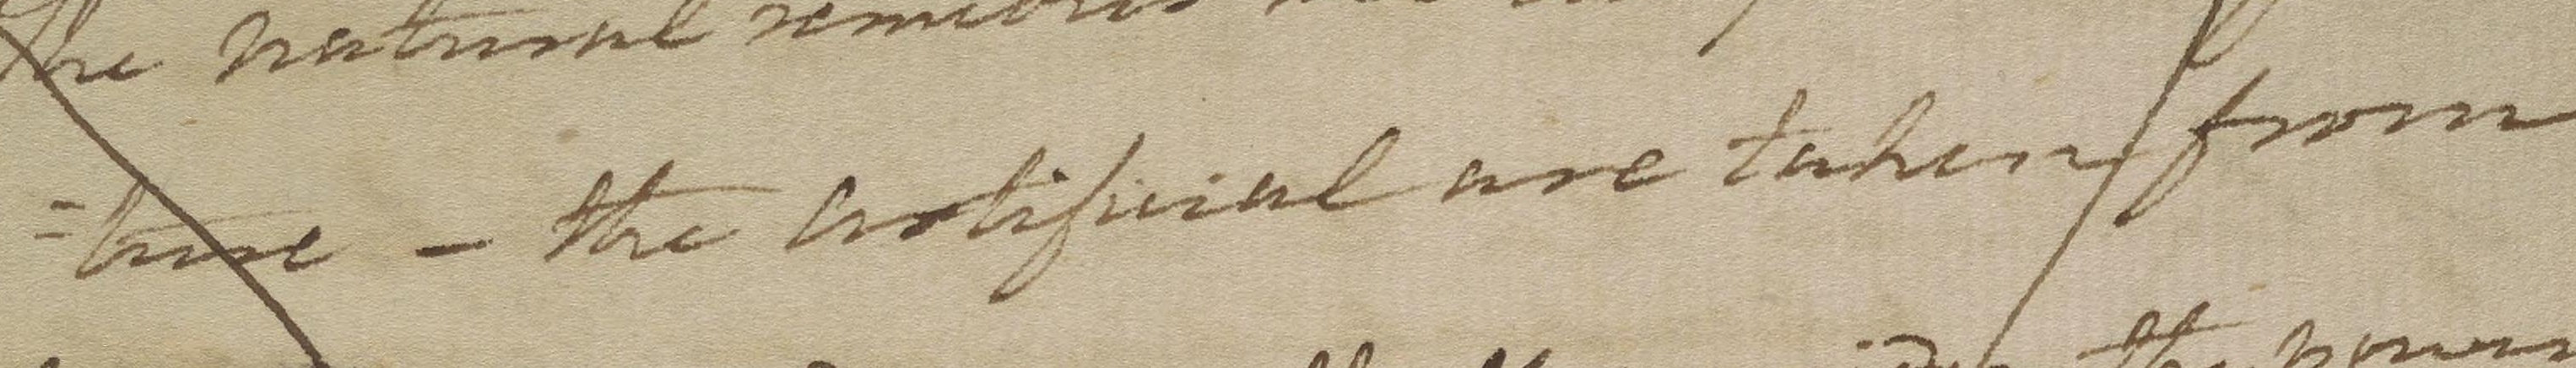-ture- the artificial are taken from
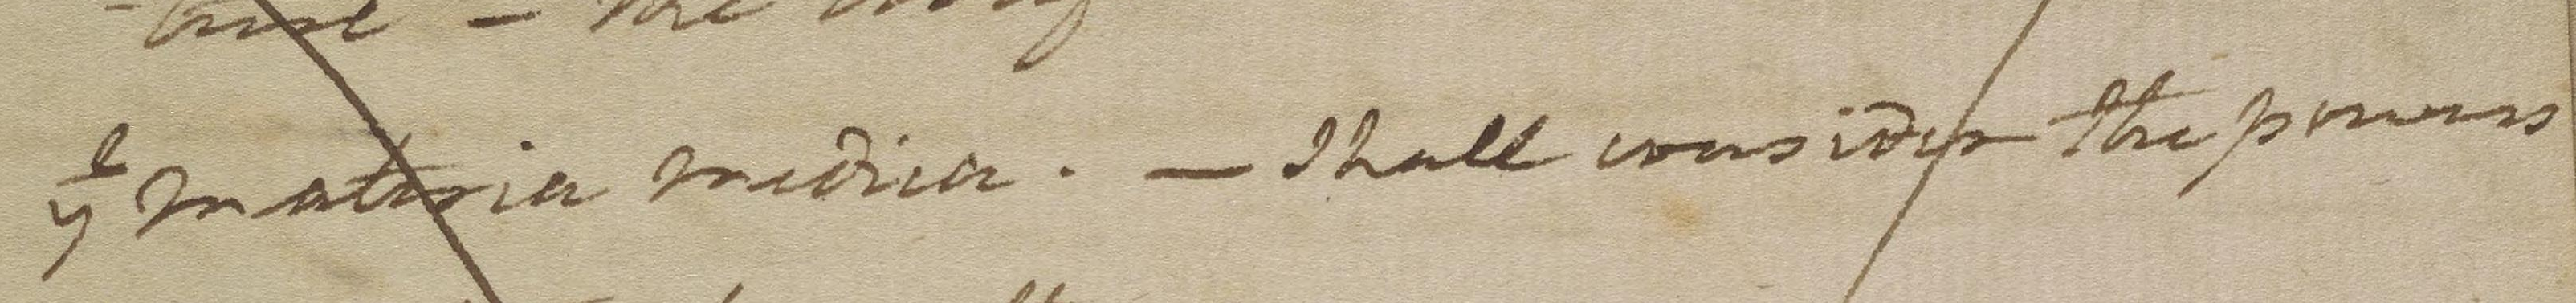y^e materia medica.- Shall consider the powers
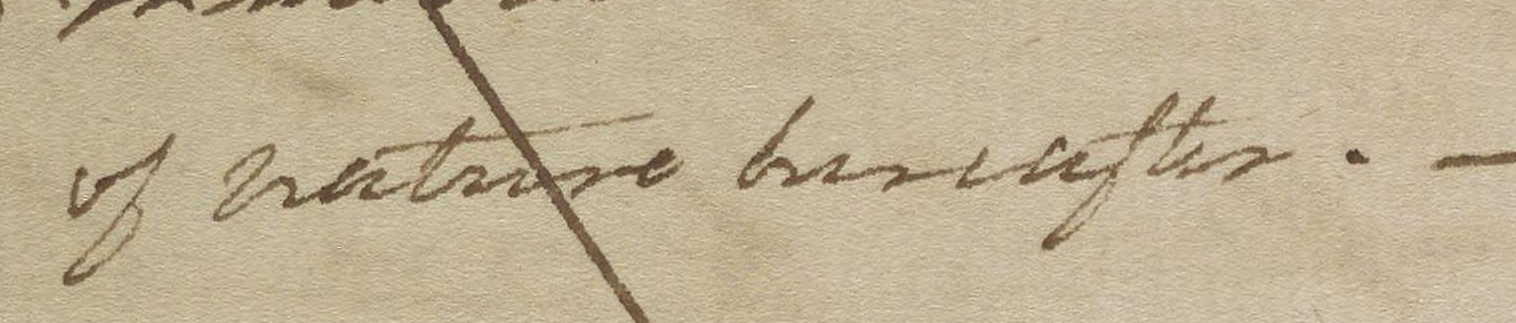of nature hereafter.-
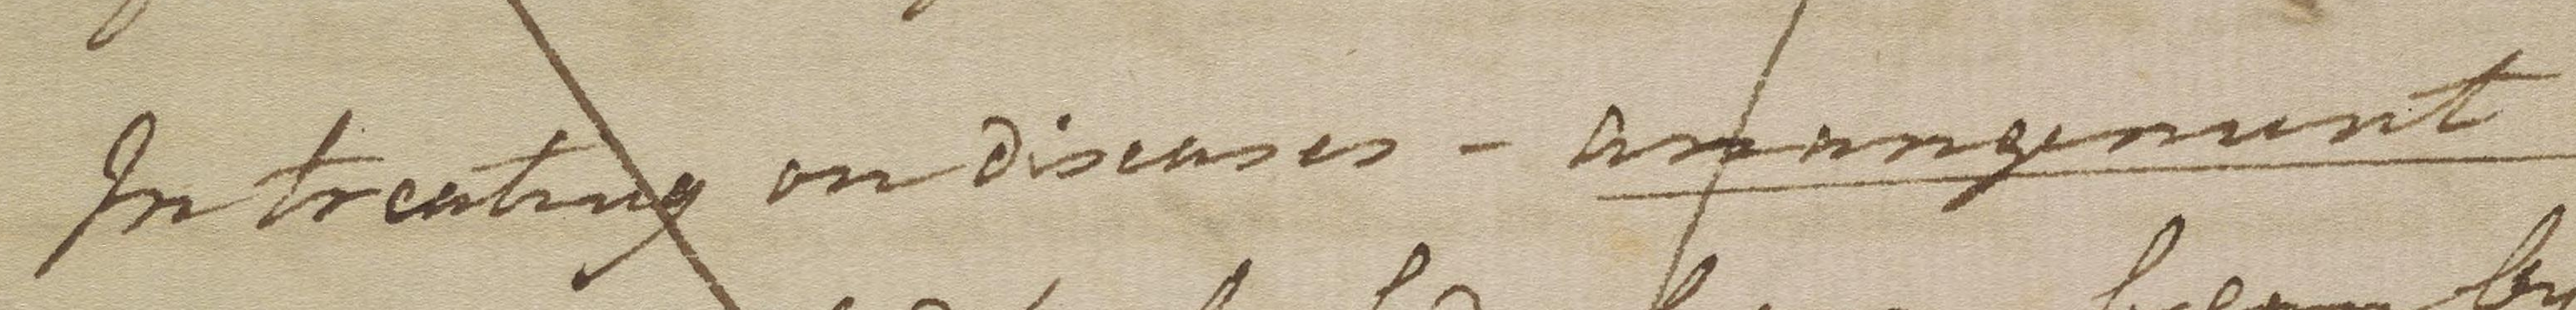In treating on diseases- arrangement
